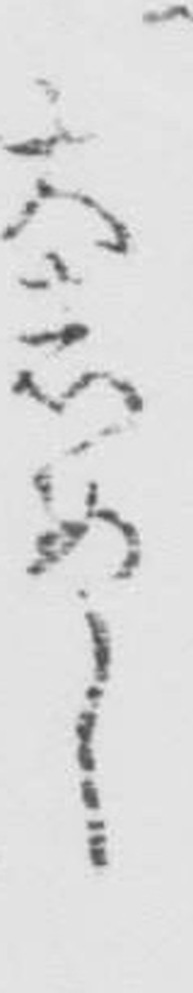大しめし
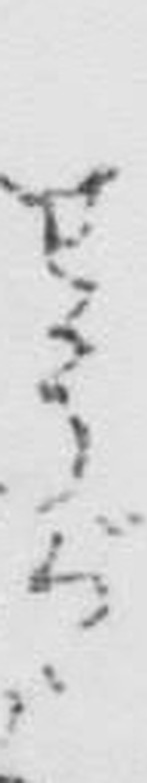せうが
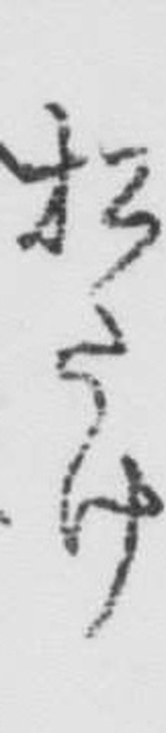松たけ
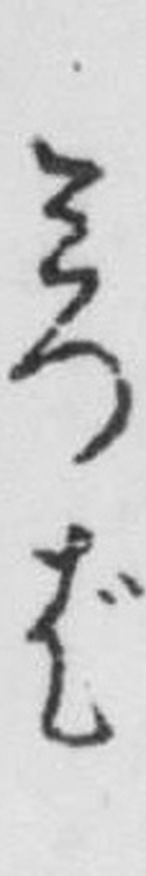みつば
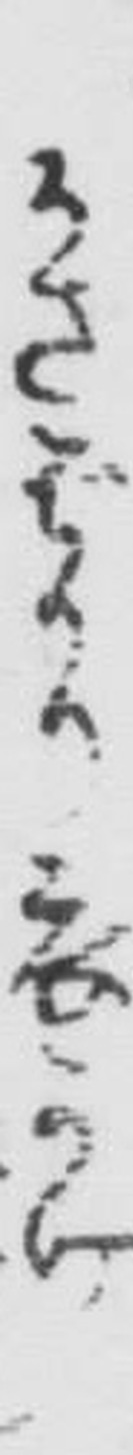かさばかり衣かけ
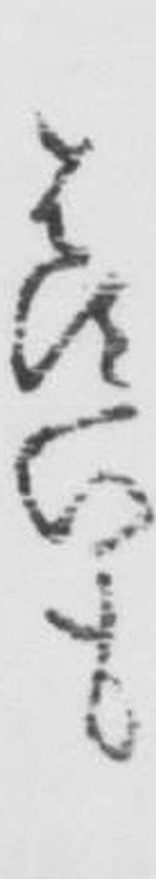はすいも
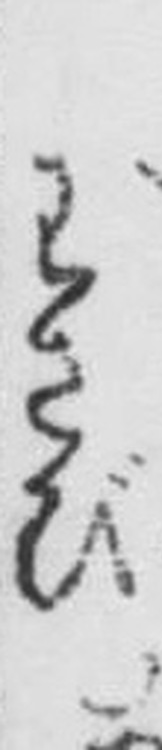わさび

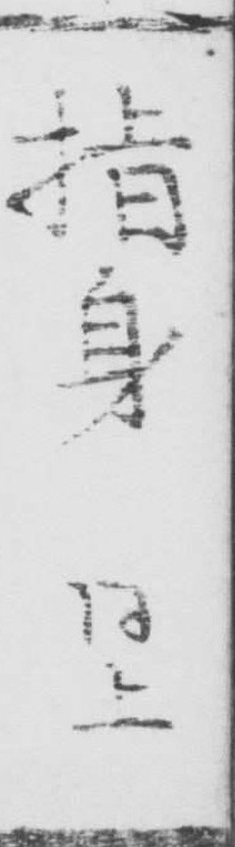指身同上
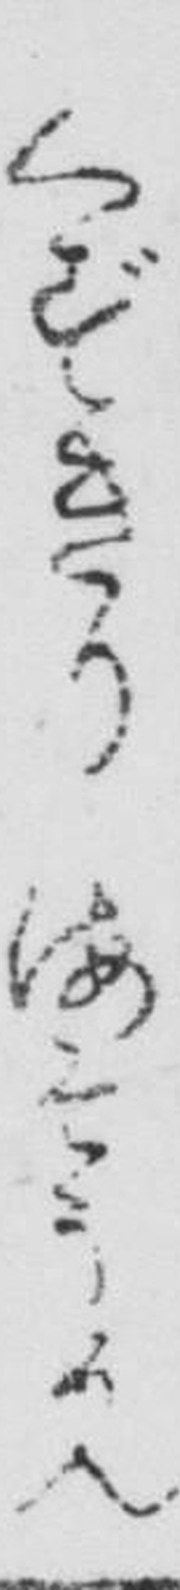くずきり海そうめん
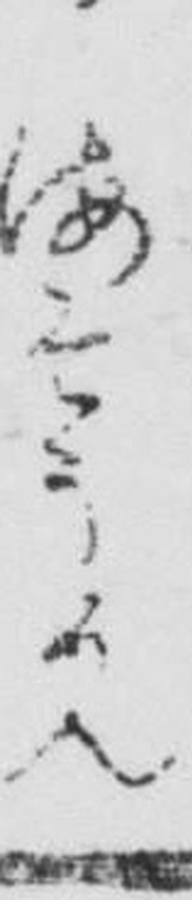海そうめん
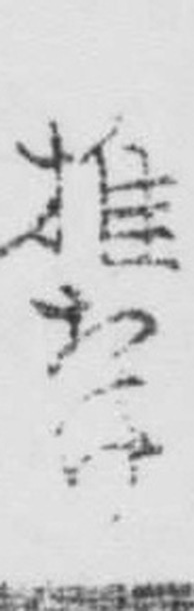岩たけ
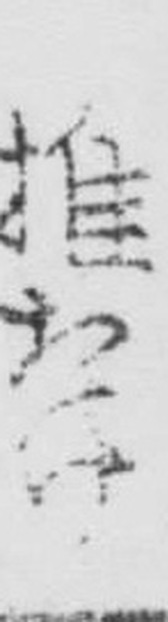岩たけ
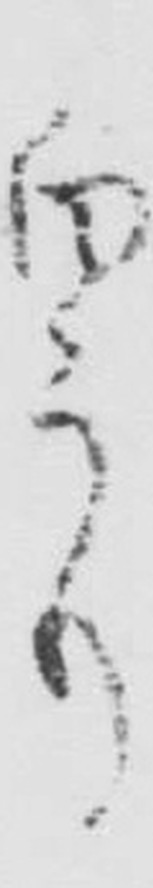白うり
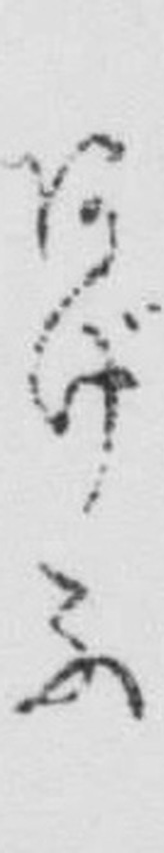あげふ
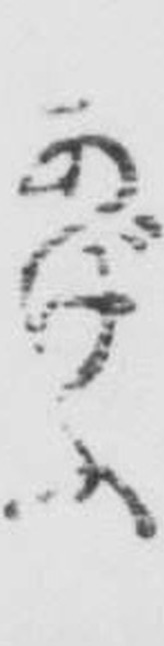あげふ
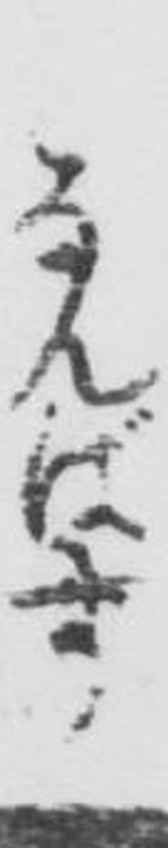なんばす
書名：諸家通用/即席料理
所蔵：大阪府立大学学術情報センター 国文学研究資料館
